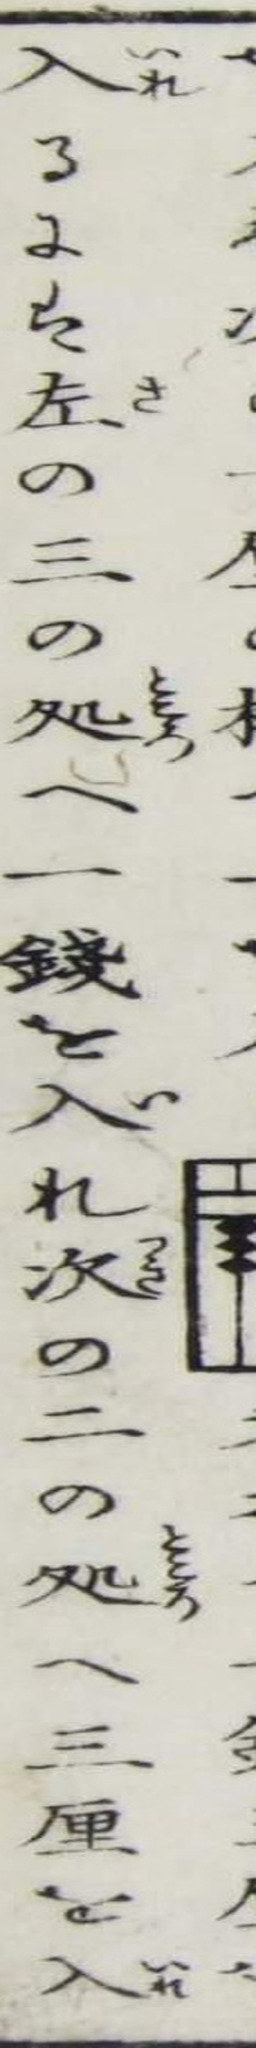入るには左の処へ一銭を入れ次の二の処へ三厘を入

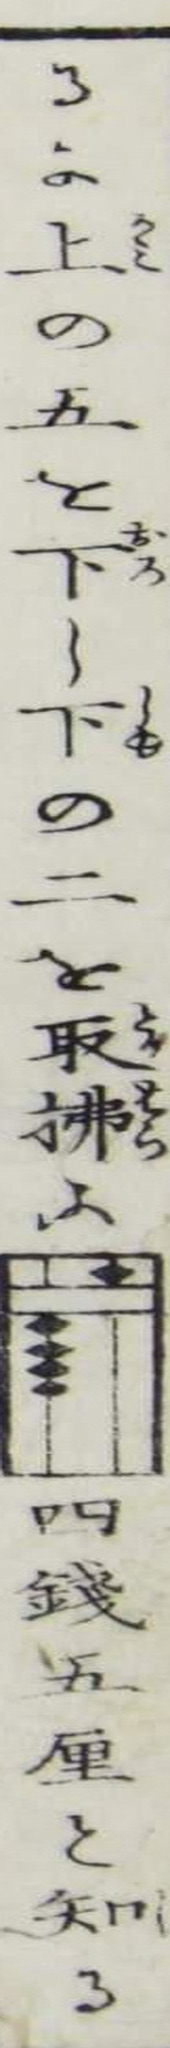るに上の五を下し下の二を取払ふ四銭五厘と知る
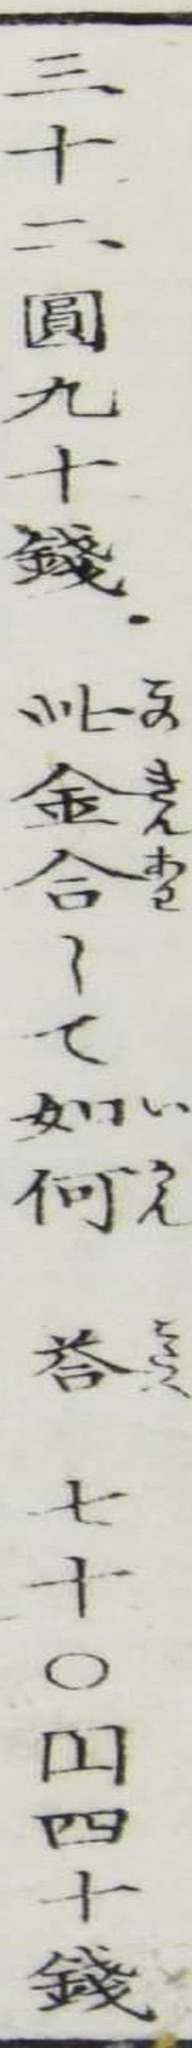三十二円九十銭．此金合して如何答七十〇円四十銭
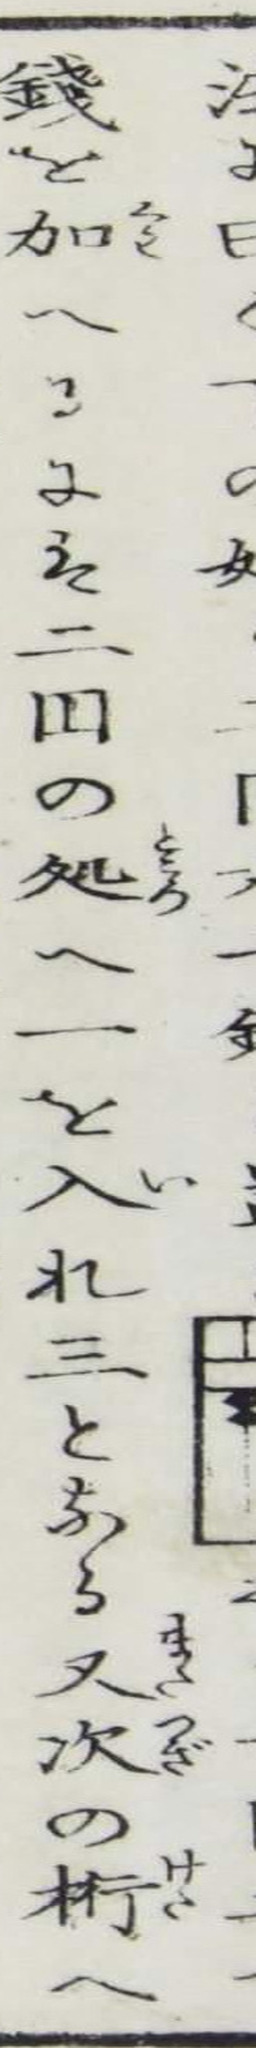銭を加へるには二円の処へ一を入れ三となる又次の桁へ
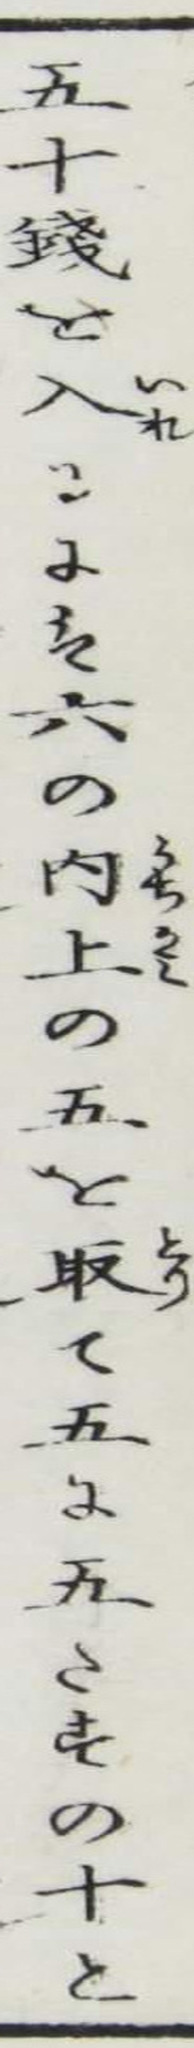五十銭を入るには六の内上の五を取て五に五たすの十と
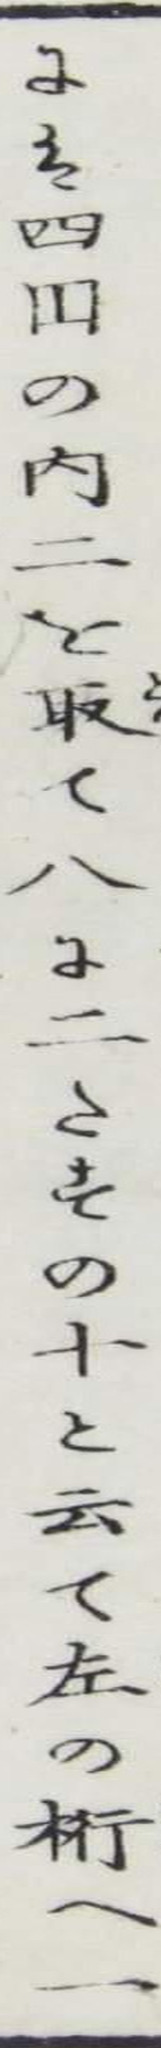には四円の内二を取て八に二たす十と云て左の桁へ一
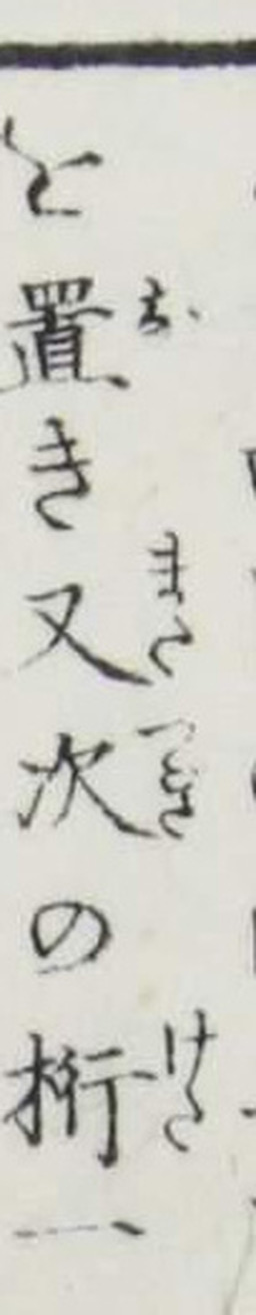を置き又次の桁一
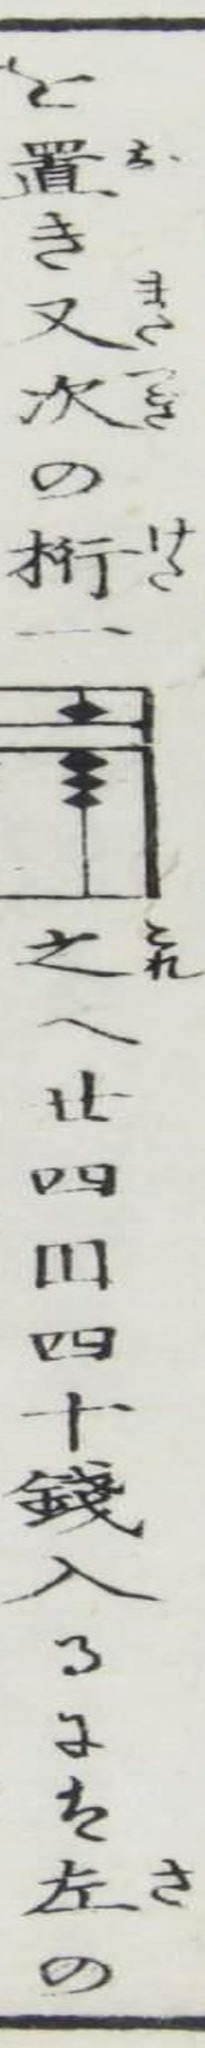を置き又次の桁一
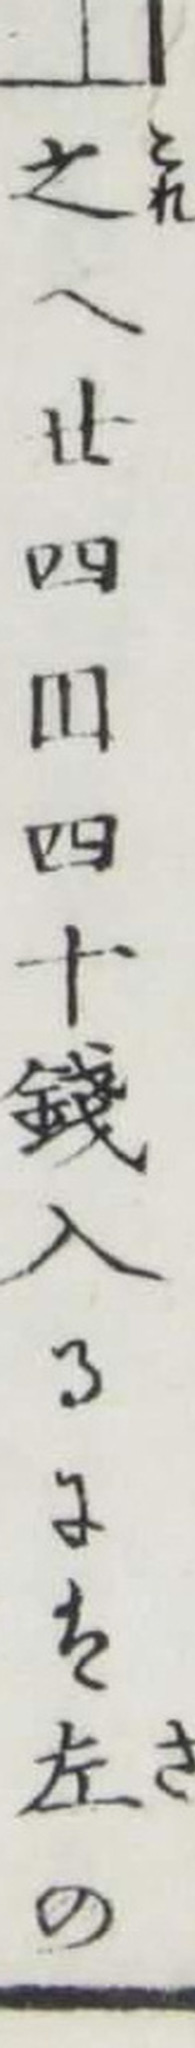之へ廿四円四十銭入るには左の
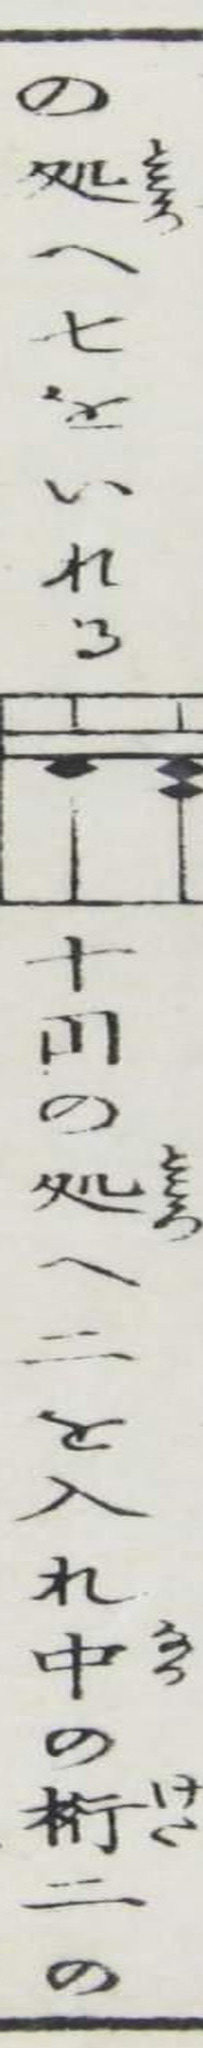の処へ七をいれる
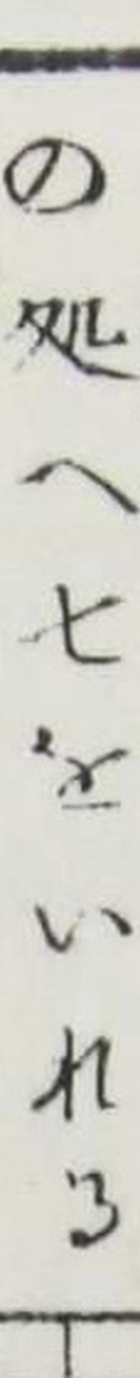の処へ七をいれる
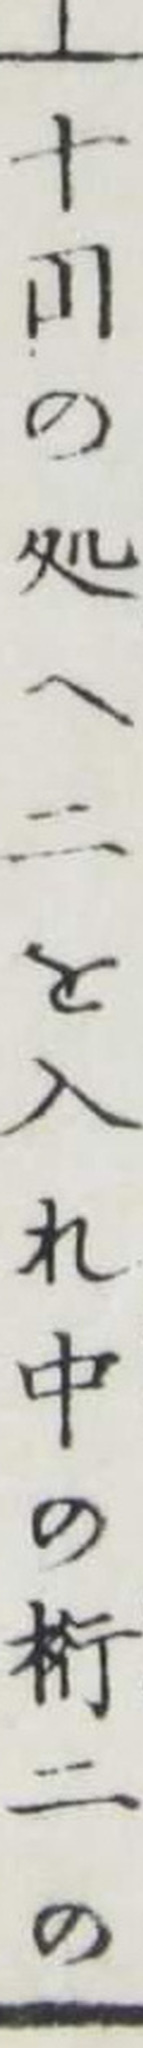十円の処へ二を入れ中の桁二の
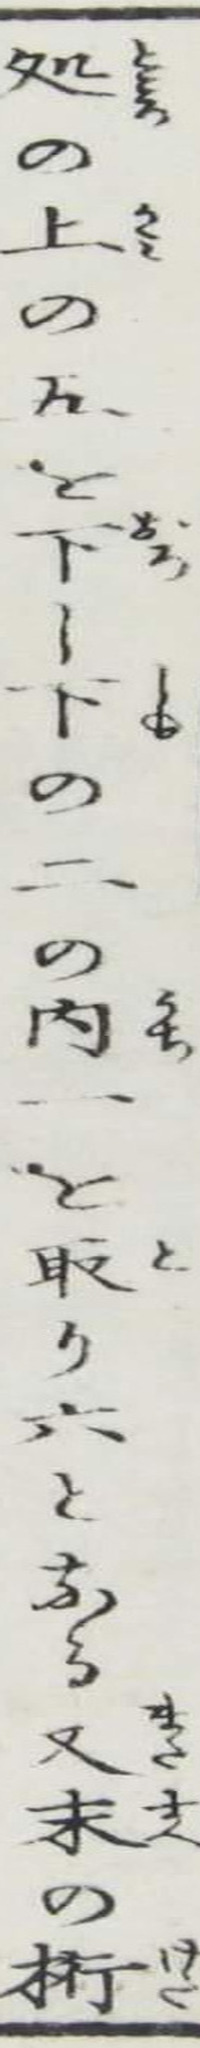処の上の五を下し下の二の内一を取り六となる又末の桁
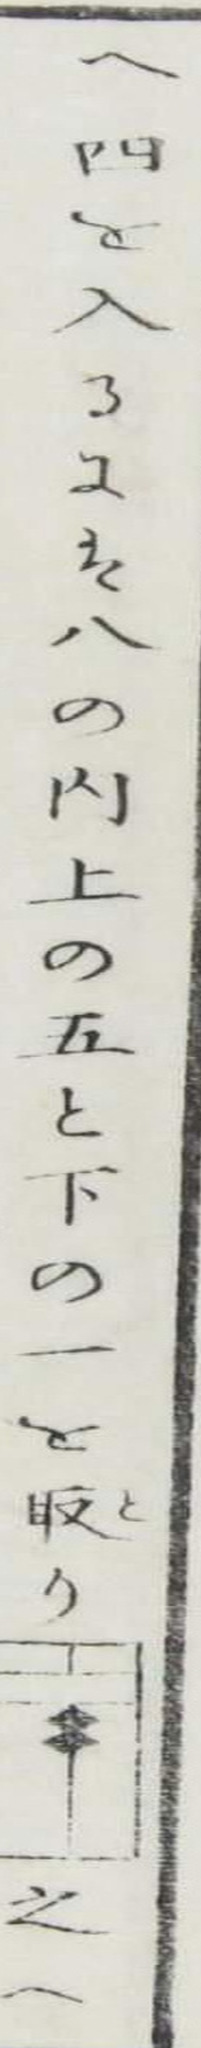へ四を入るには八の内上の五と下の一を取り
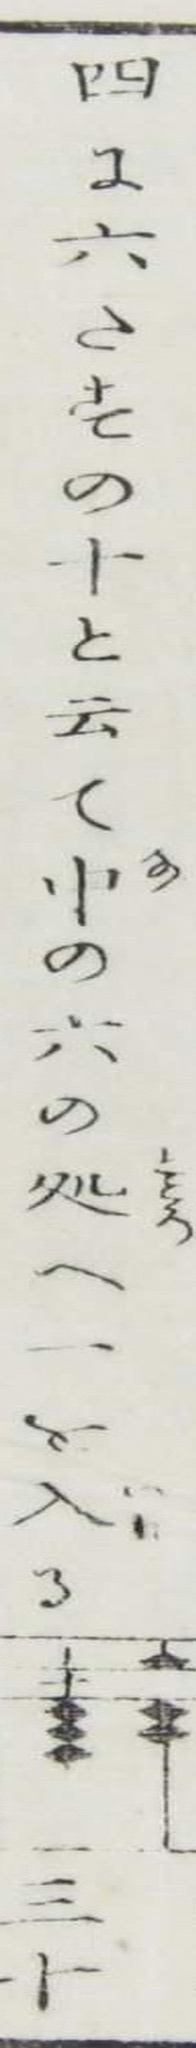四に六たすの十と云て中の六の処へ一を入る
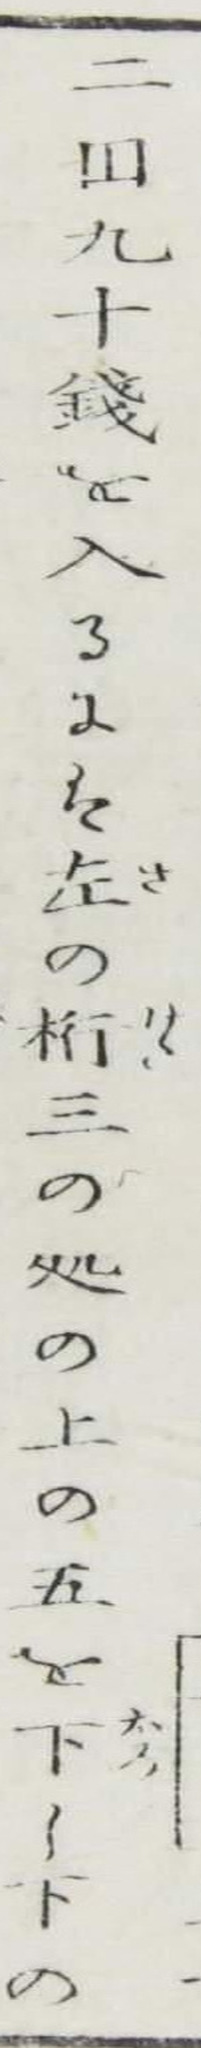二円九十銭を入るには左の桁三の処の上の五を下し下の
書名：明治小學塵劫記 卷1
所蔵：東京学芸大学教育コンテンツアーカイブ
